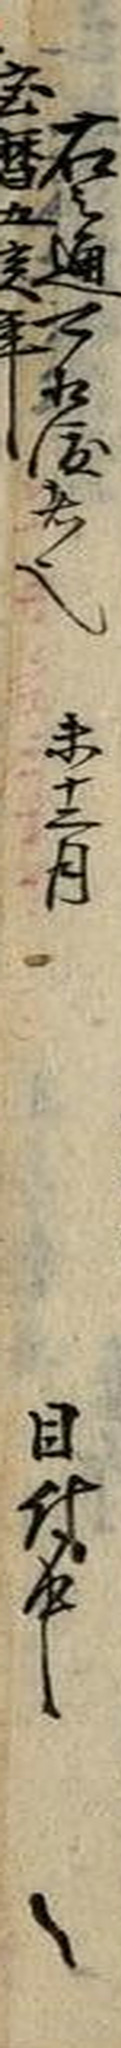右之通可相渡者也未十二月目付中
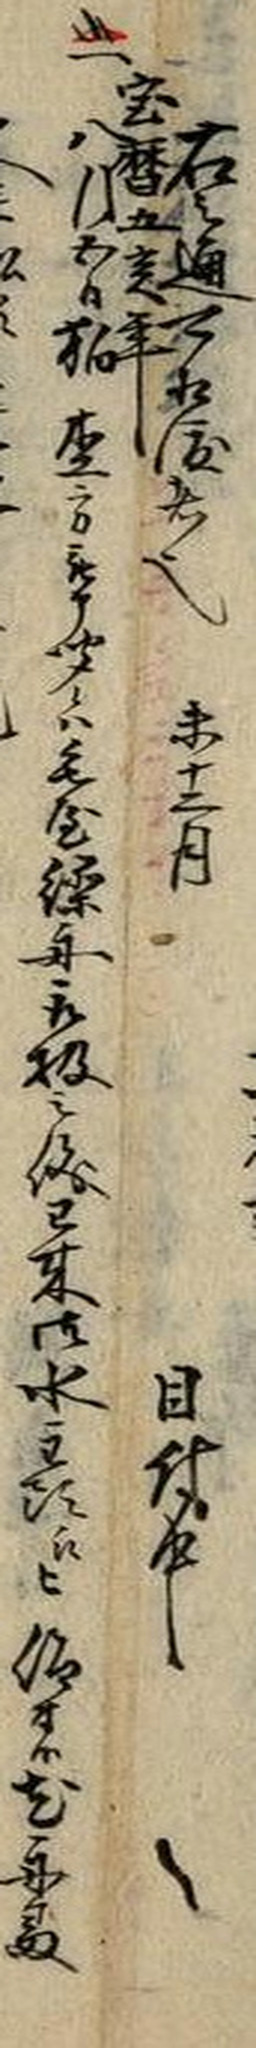一八月五日狛杢方被申聞候は毛屋繰舟取扱之儀已来御水主頭え被仰付候尤舟番
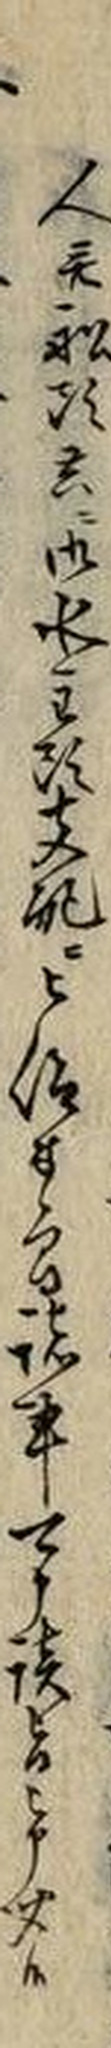人并船頭共に御水主頭支配に被仰付候間諸事可申談旨被申聞候
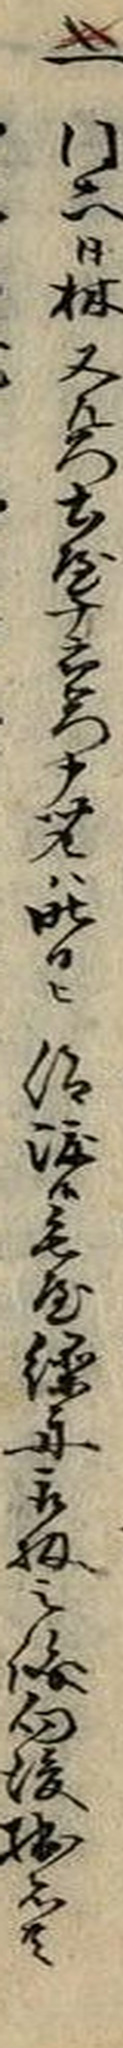一同六日林又左衛門土屋十郎右衛門申聞候は昨日被仰渡候毛屋繰舟取扱之儀向後拙者共
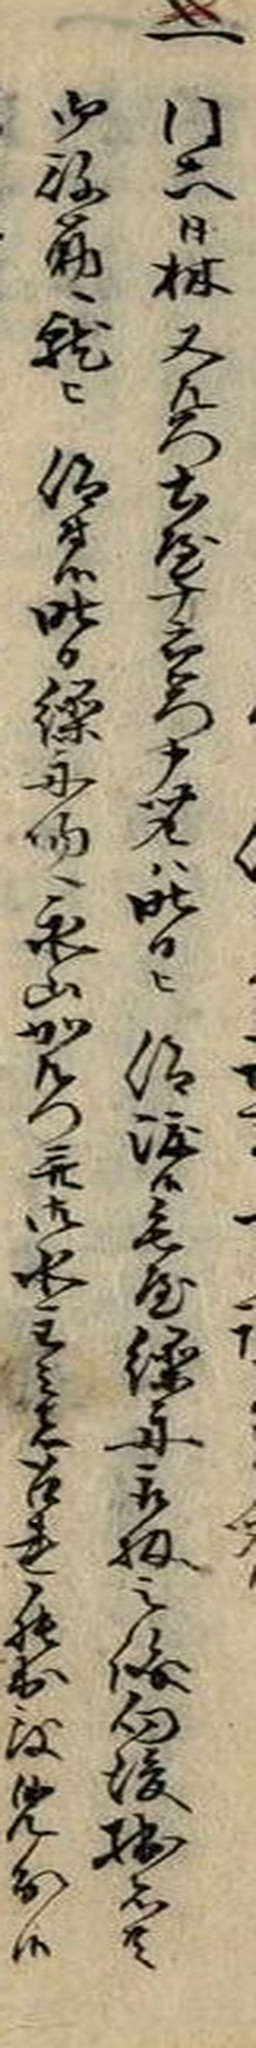御役筋へ就被仰付候昨日繰舟場へ永山加左衛門并御水主之者召連罷出致見分候
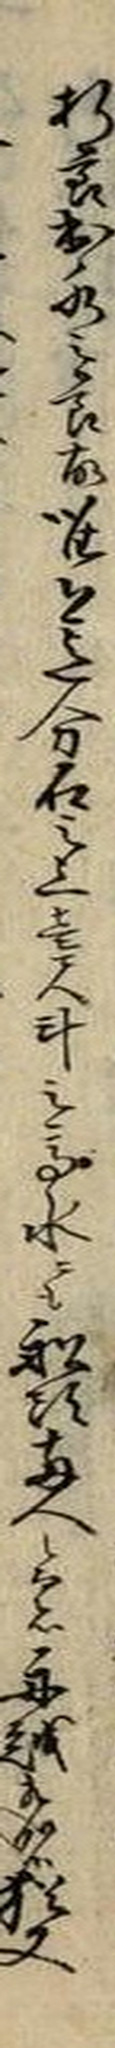折節出水之節故唯今迄分石之上壱尺斗之高水にも船頭両人候ては舟越相成候猶又
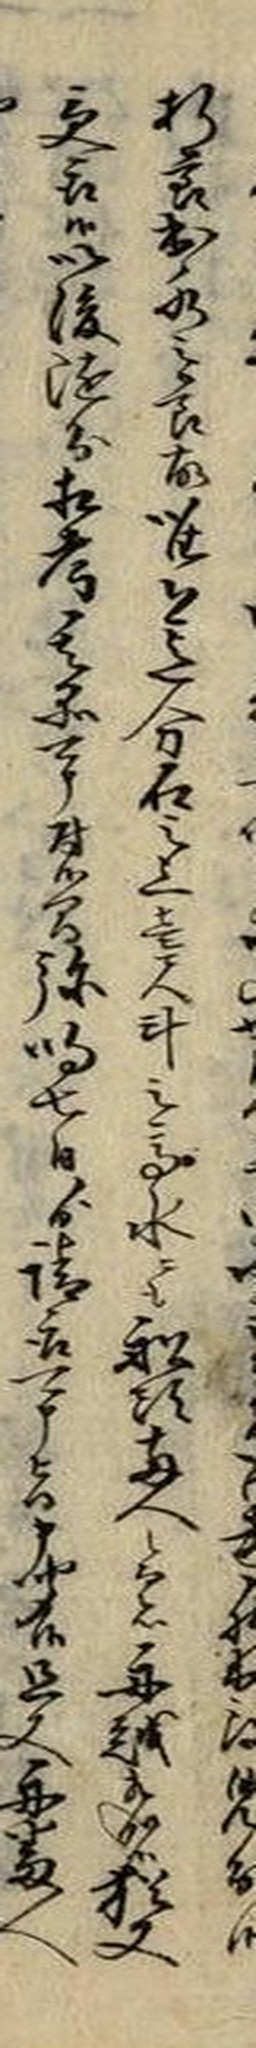受取候以後随分相考其品可申付候間弥明七日ゟ請取可申旨申聞候且又舟番人
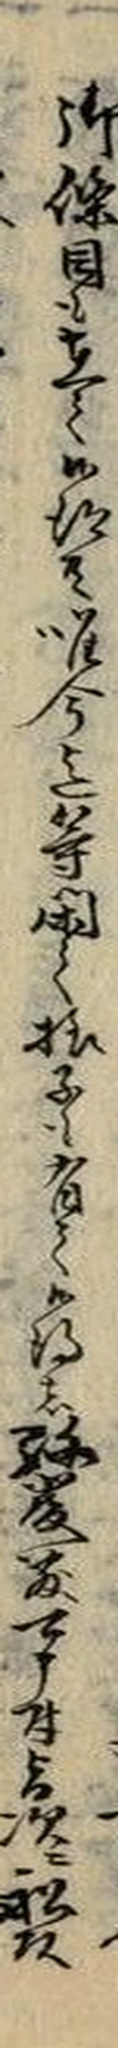御条目も在之候得共唯今迄等閑之様子も有之候得は弥厳敷可申付旨次に船頭
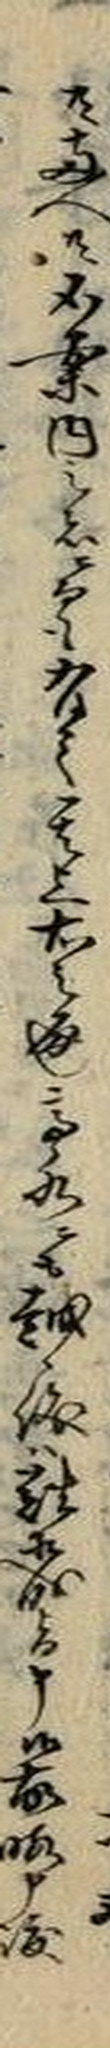共両人共不案内之者にても有之其上右之通高水にも越候儀は難相成旨申候故暇申渡
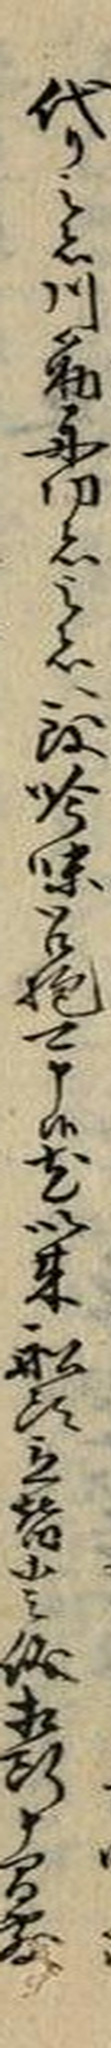代り之者川筋舟功者之者へ致吟味召抱可申候尤以来船頭立替等之儀相断申間敷
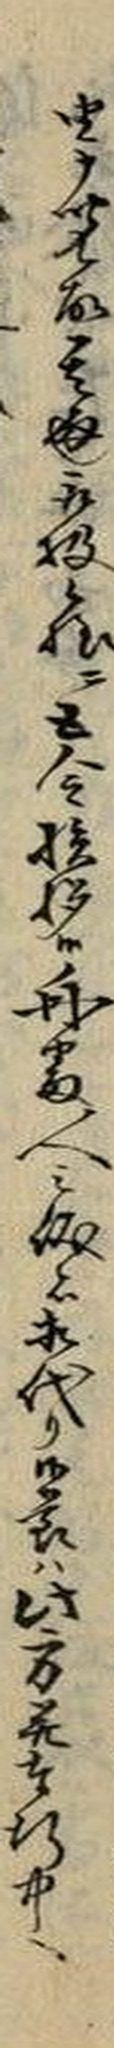由申聞候故其通取扱候様にと令挨拶候舟番人之儀は相代り候節は此方并奉行中へ
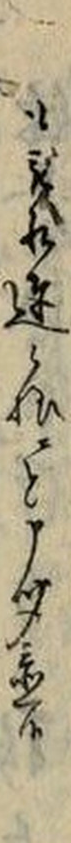も被相達候様にと申聞置候
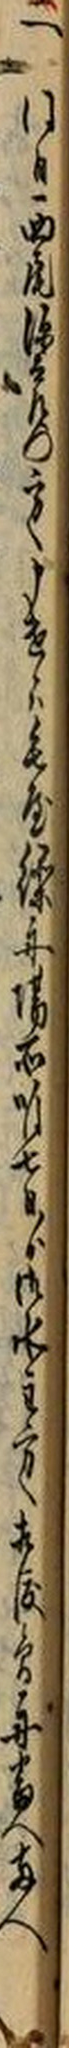一同日西尾源太左衛門方へ申遣候は毛屋繰舟場所明七日ゟ御水主方へ相渡候間舟番人両人
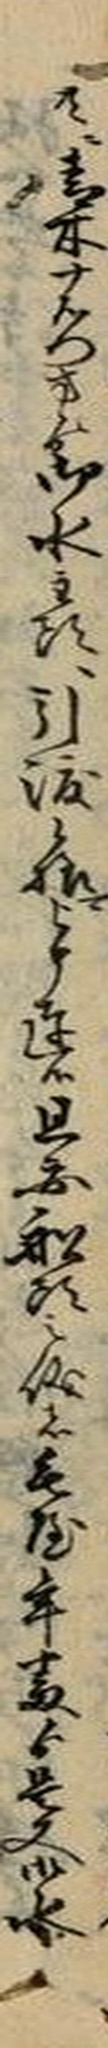共に青木十左衛門方ゟ御水主頭へ引渡候様可被申達候且亦船頭之儀は毛屋年番ゟ是又御水
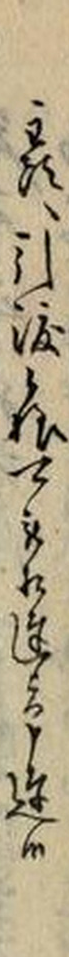主頭へ引渡候様可被相達旨申達候
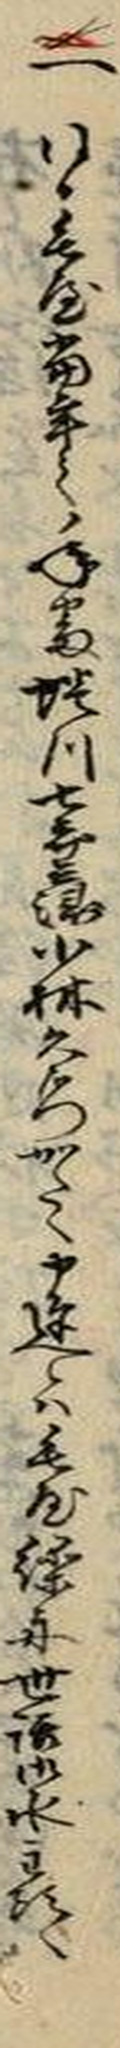一同日毛屋当年之年番蜷川七郎兵衛小林久右衛門かたへ申達候は毛屋繰舟世話御水主頭へ
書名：御城下諸事之部
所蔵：福井県文書館 Fukui Prefectural Archives
